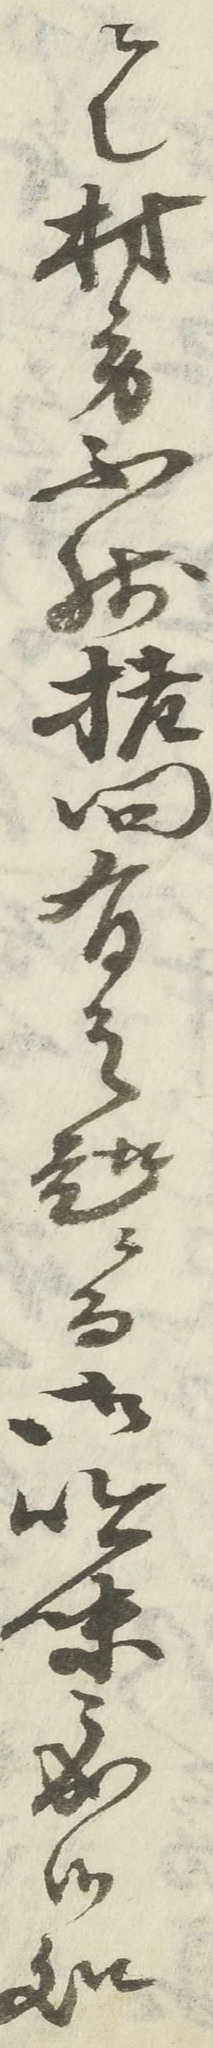ニて村方不残拷問有之趣ニ而御吟味被成候処
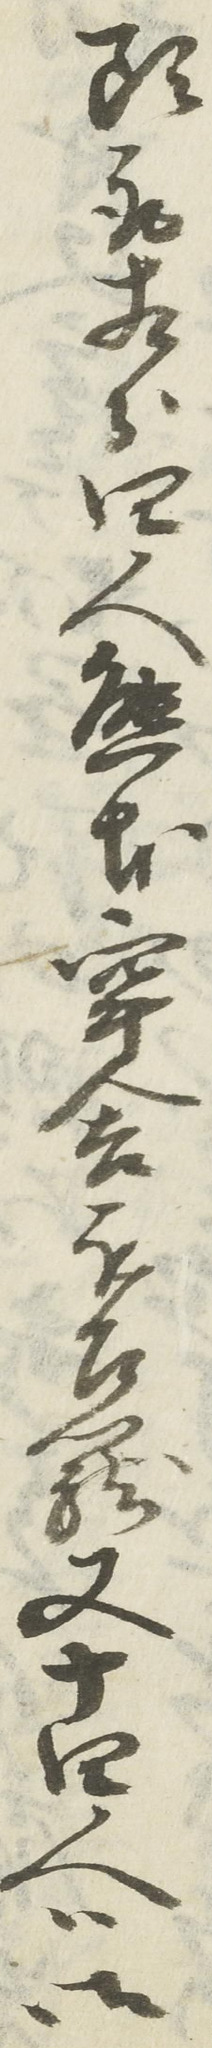頭取相分四人熊本牢舎被召寵又十四人は御
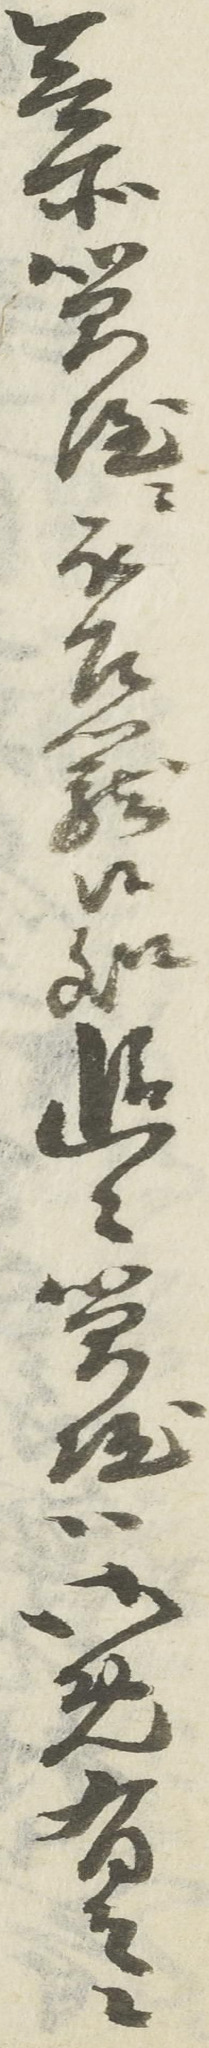答所笞屋ニ被召寵候処追々節屋は御免有之
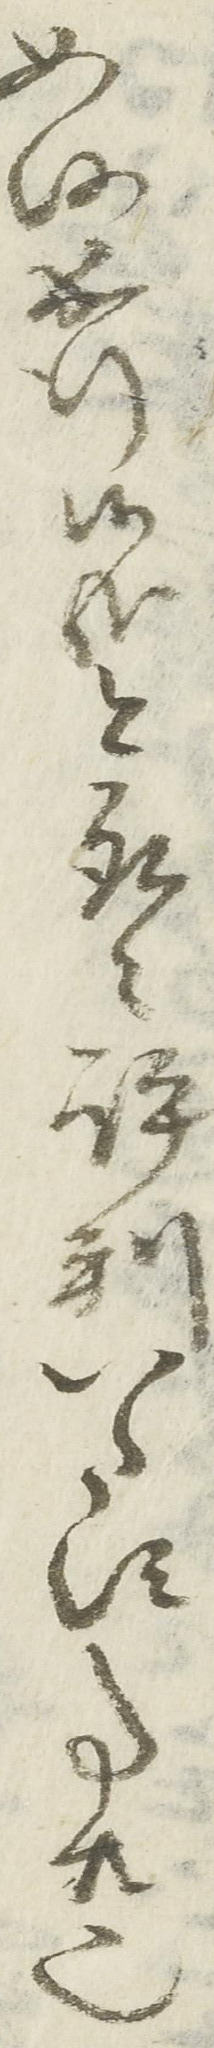如何成行候哉と取々評判いたす事共也
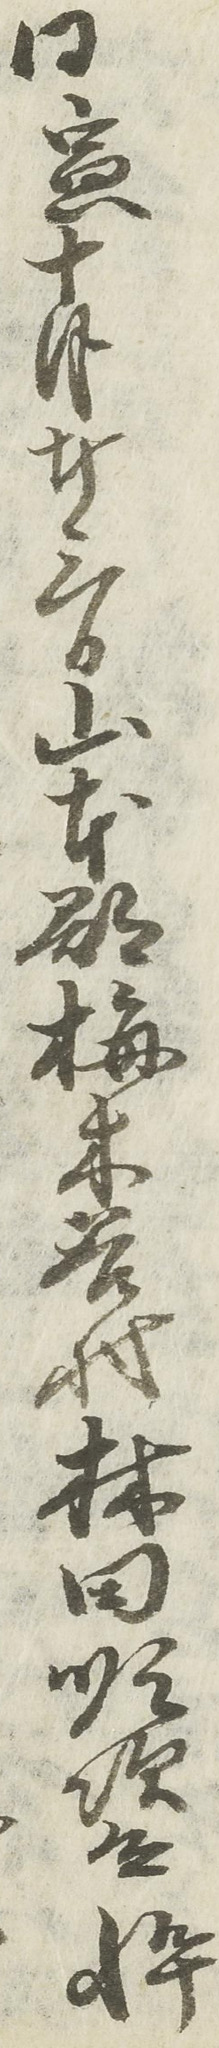一同寅十月廿三日山本郡梅木谷村林田順次殿倅
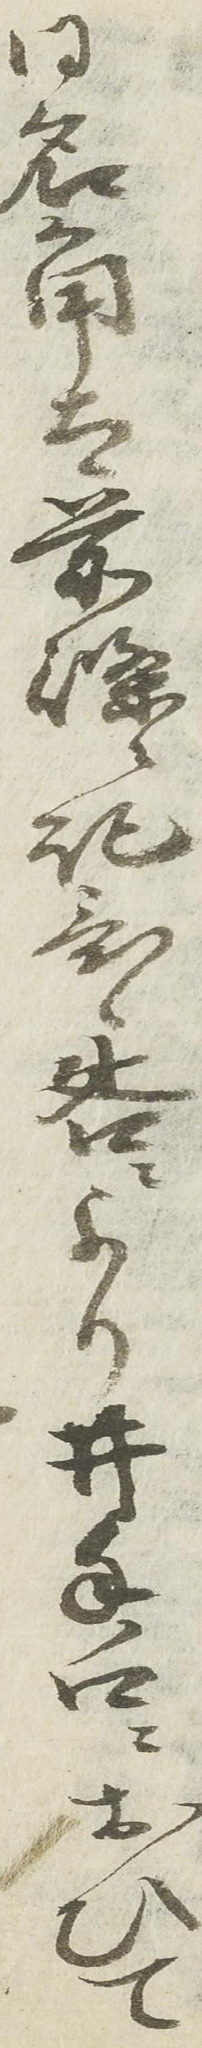同名角太前条ニ記置候咎ニより井手ノ口ニおひて
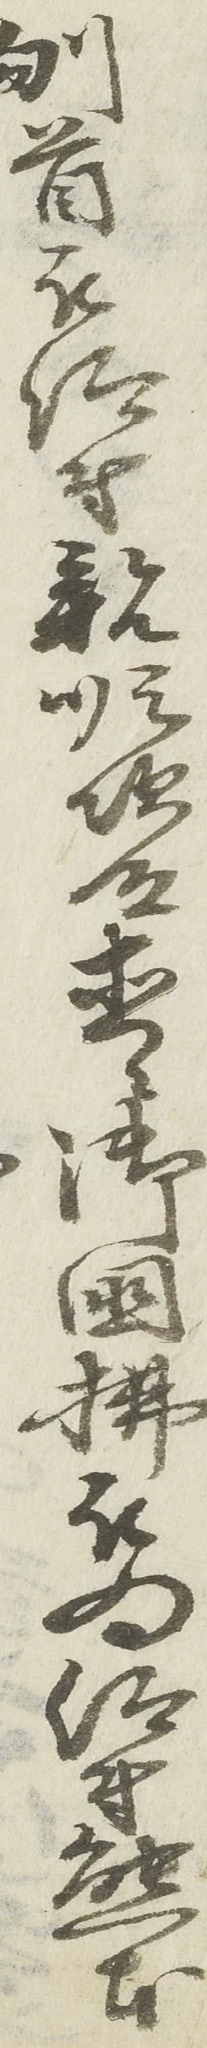刎首被仰付親順次殿直々御国払被為仰付熊本
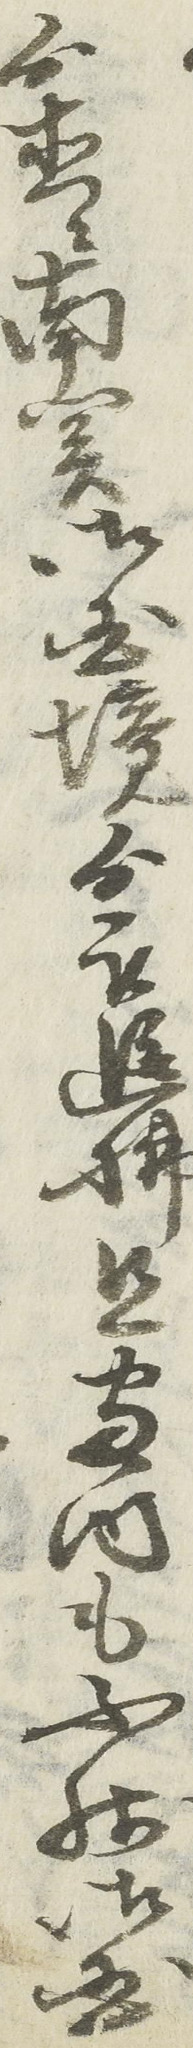ゟ直々南関御国境ゟ被追払且家内も不残御国
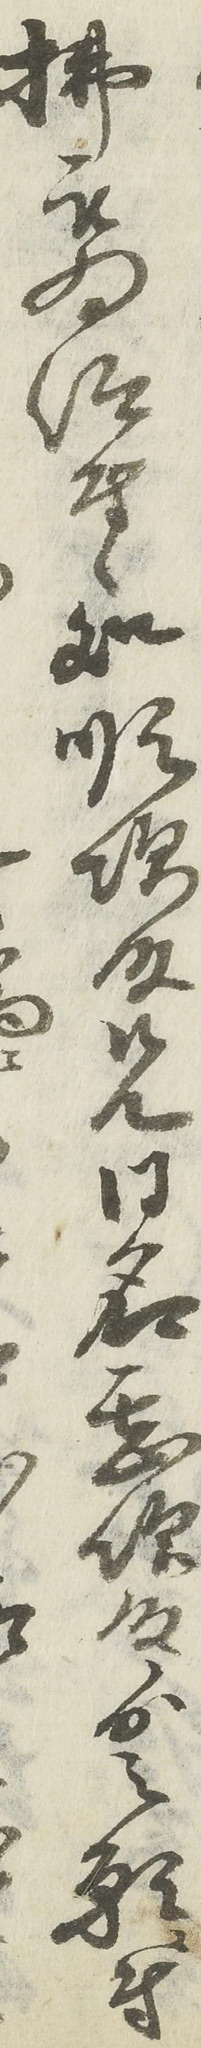払被為仰付候処順次殿兄同名甚次殿ゟ之願ニ付
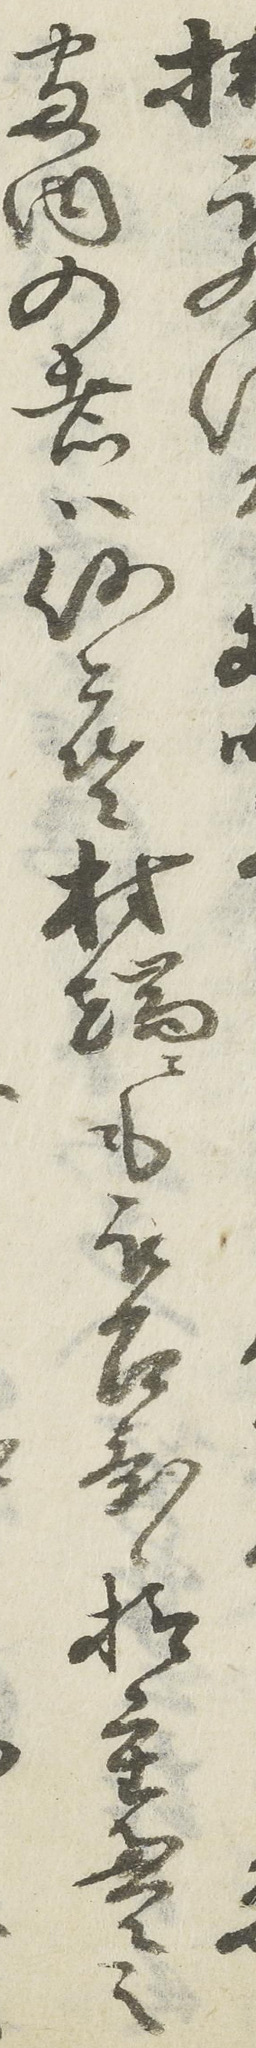家内の者は何とそ村端ニも被召置候様重畳之
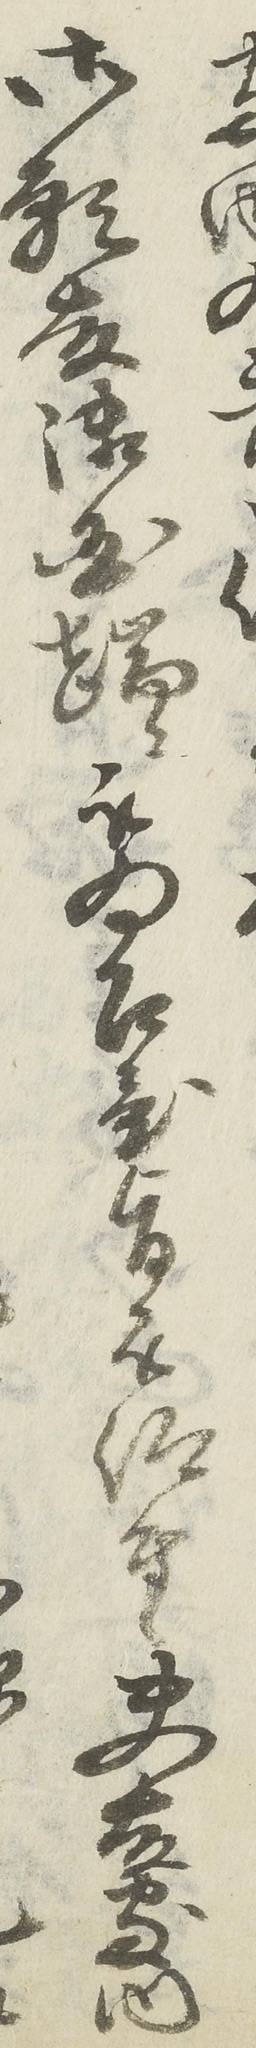御願故御国端ニ被為召置旨被仰付候夫故家内
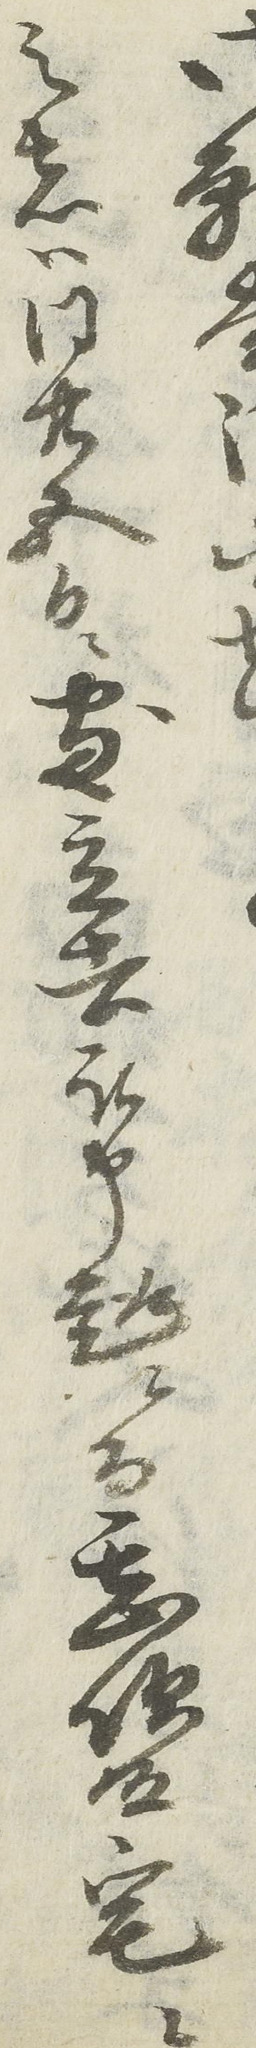之者は同廿五日ニ家立去被申趣ニ而甚次殿宅ニ
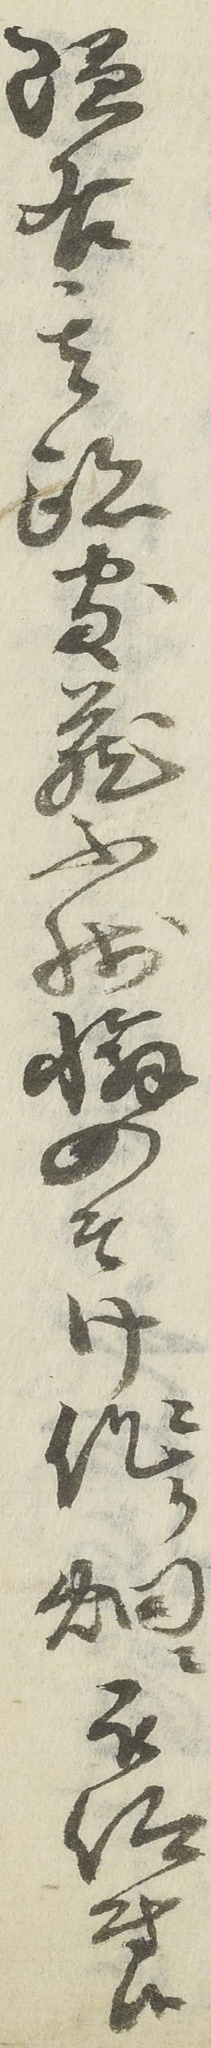隠居其跡家蔵不残懈のそけ作り畑ニ被仰付候

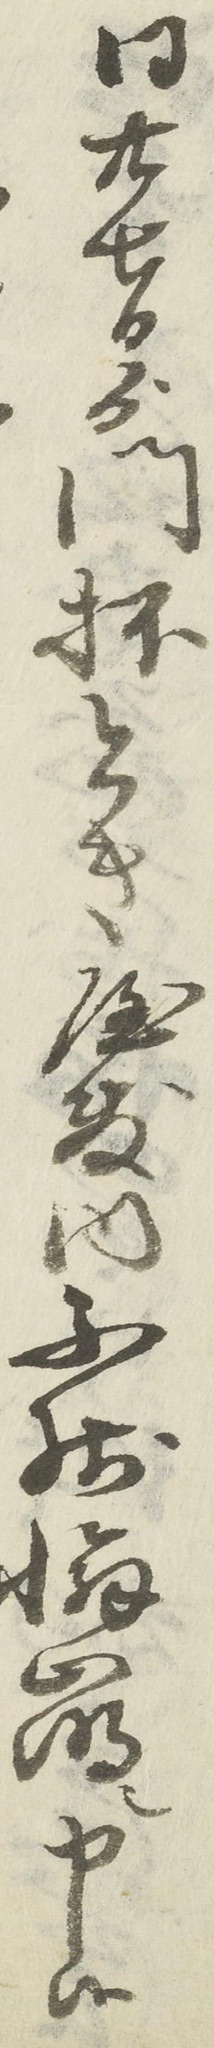同廿七日ゟ門抔とき屋敷内不残懈崩シ申候
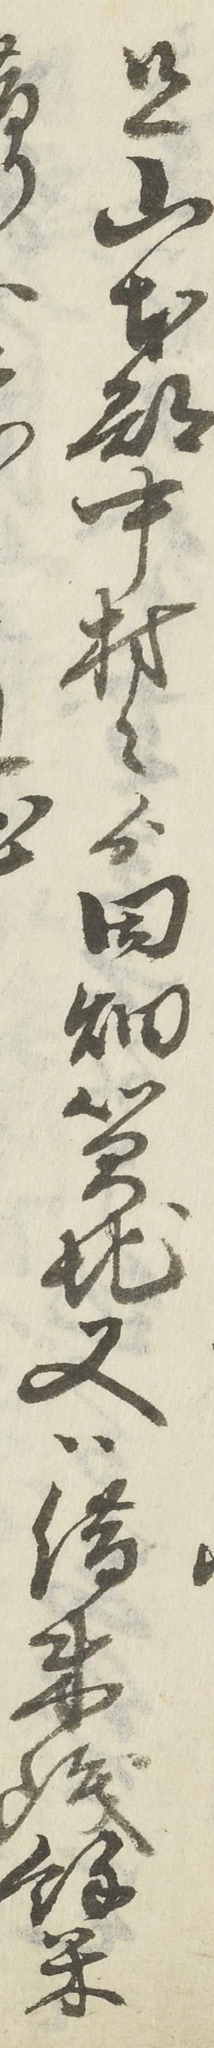且山本郡中村々ゟ田畑節地又は借米残餘米
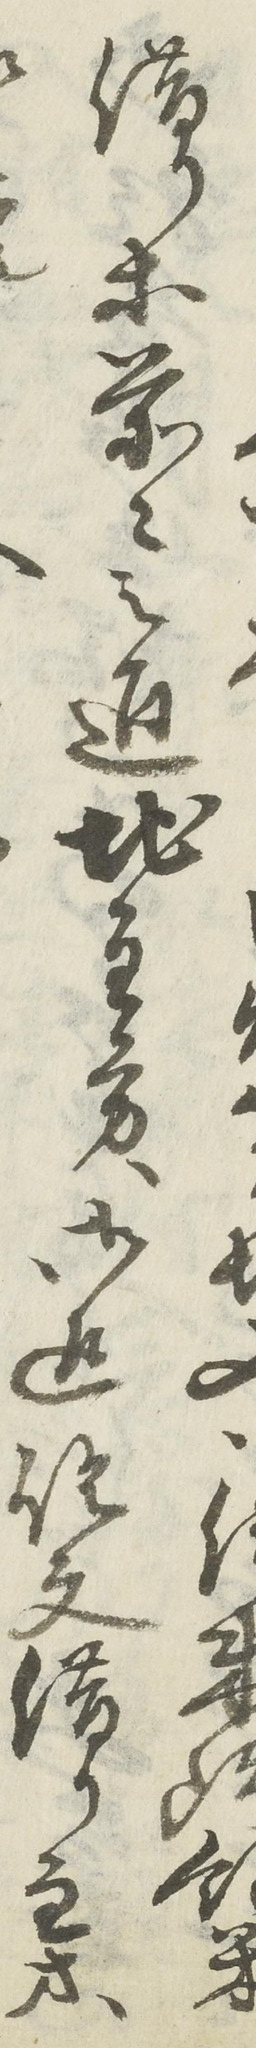借り等前々之通地主方へ御返證文借り主方へ
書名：後見笑
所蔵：東京大学地震研究所図書室 Earthquake Research Institute Library, The University of Tokyo, JAPAN
